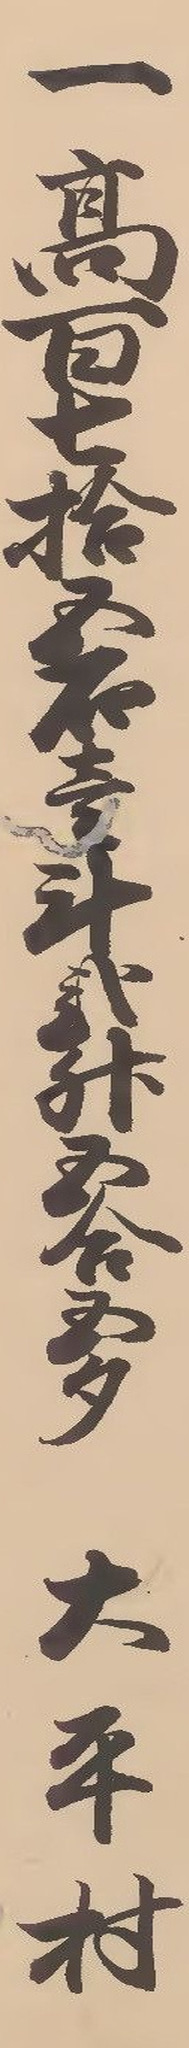一高百七拾五石壱斗弐升五合五勺大平村

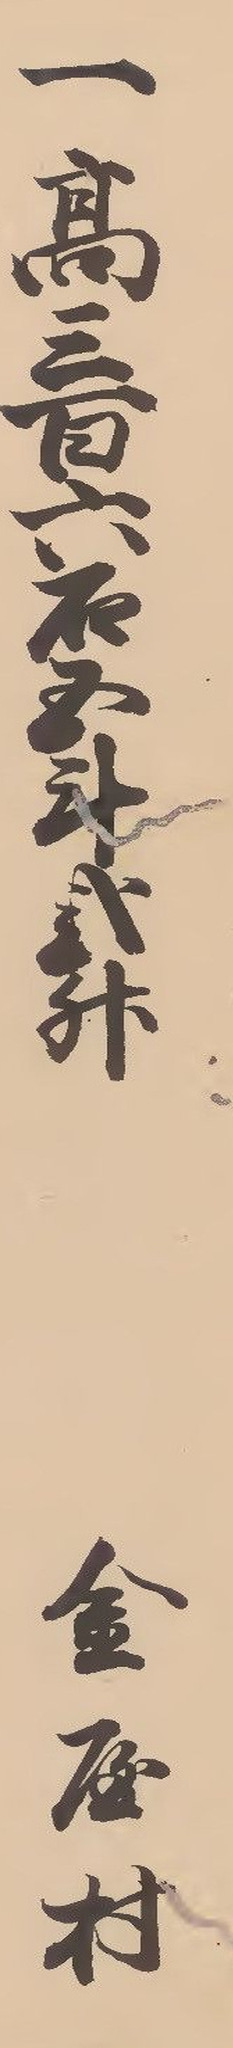一高三百六石五斗弐升金屋村
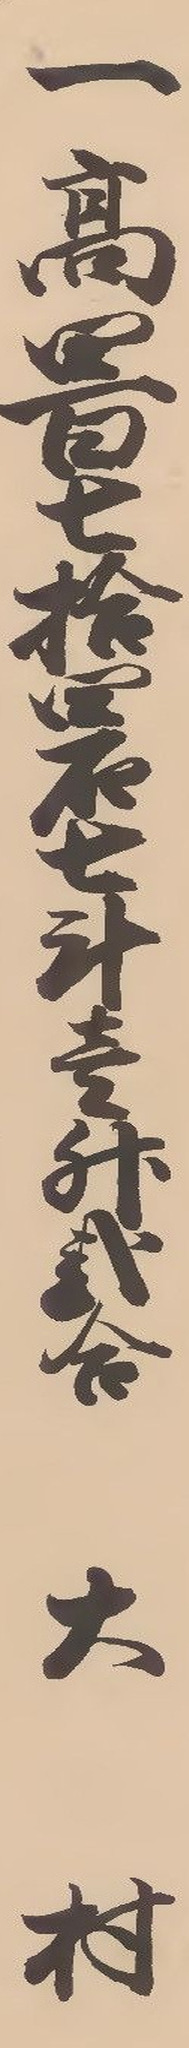一高四百七拾四石七斗壱升弐合大村
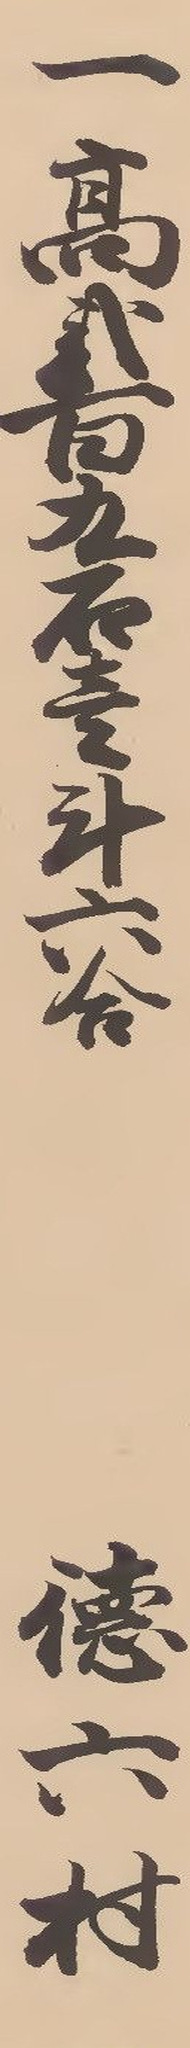一高弐百九石壱斗六合徳六村
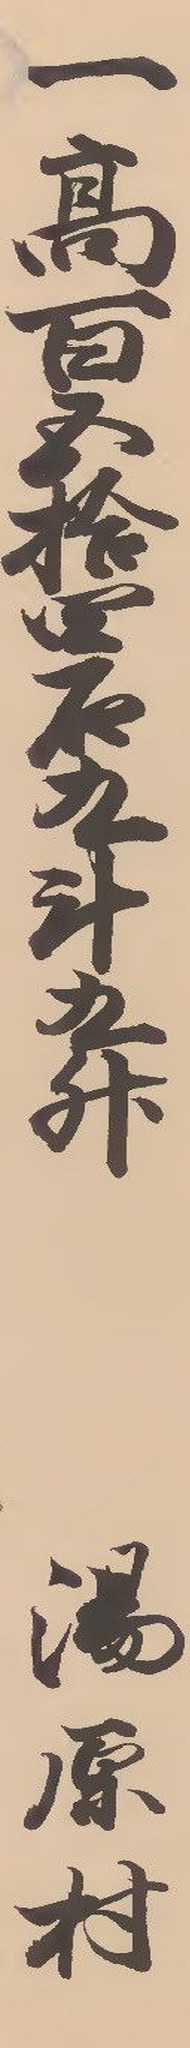一高百五拾四石九斗九升湯原村
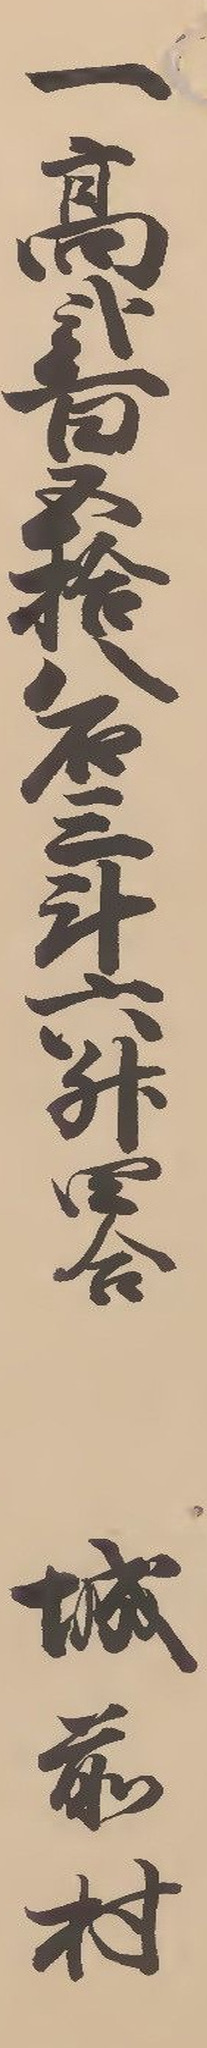一高弐百五拾八石三斗六升四合城前村
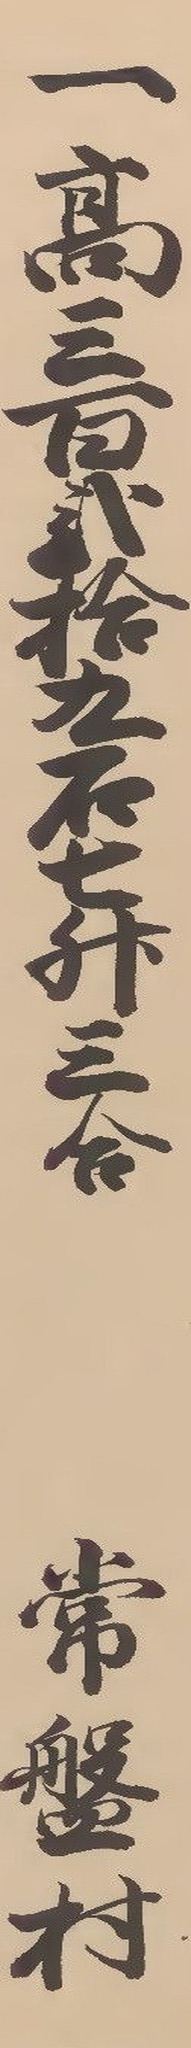一高三百弐拾九石七升三合常盤村
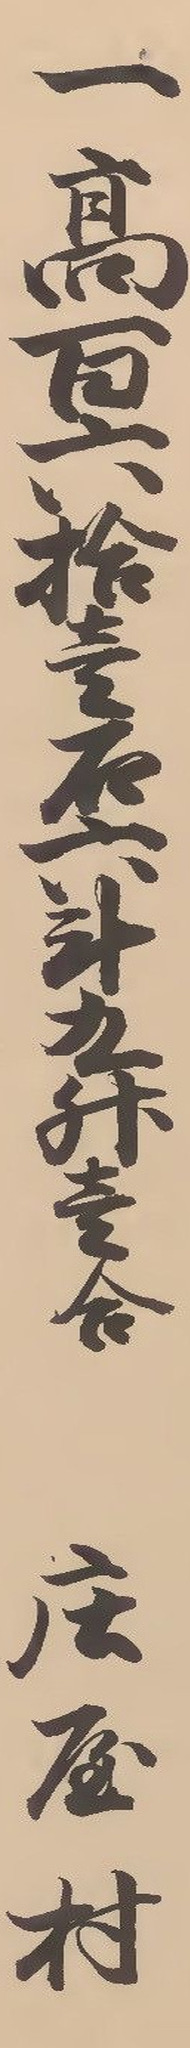一高百六拾壱石六斗九升壱合庄屋村
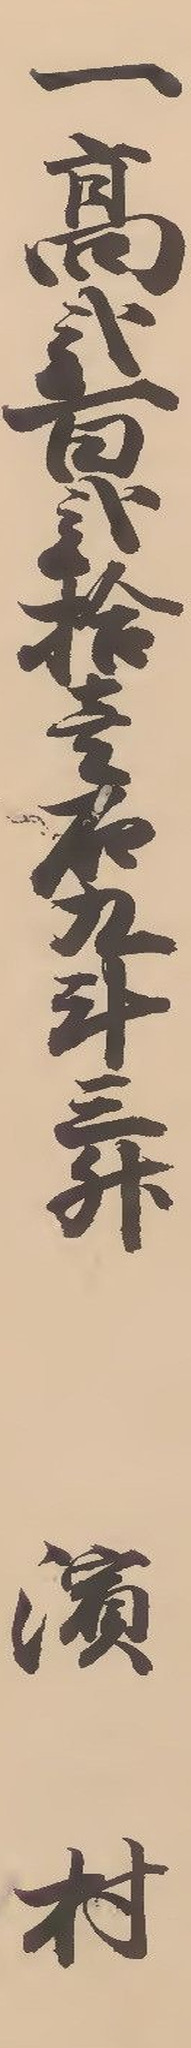一高弐百弐拾壱石九斗三升浜村

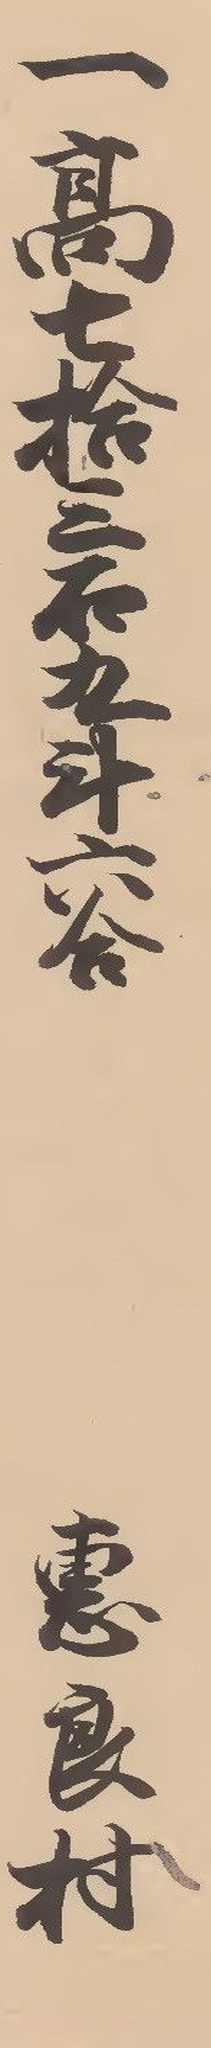一高七拾三石九斗六合恵良村
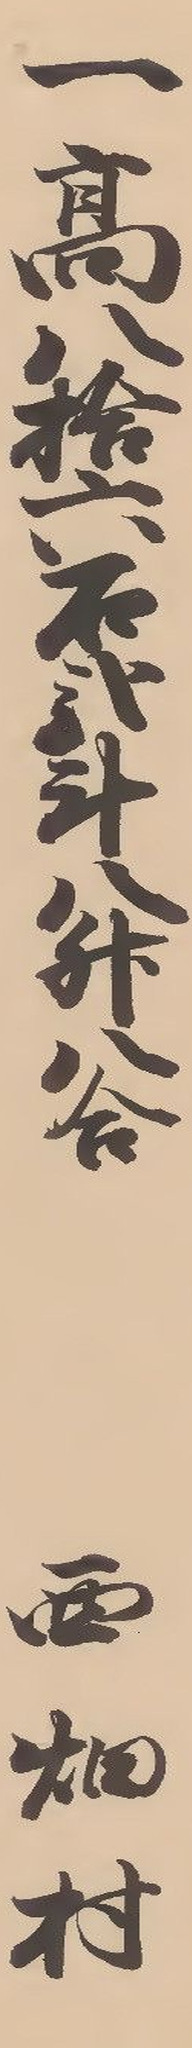一高八拾六石弐斗八升八合西畑村
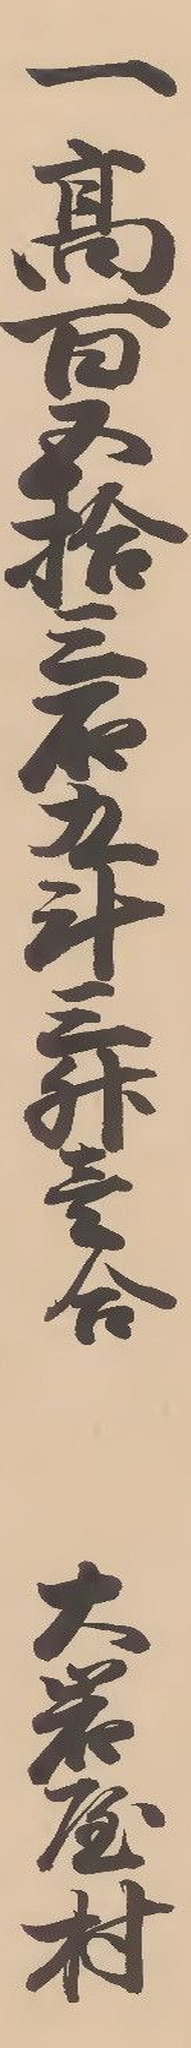一高百五拾三石九斗三升壱合大岩屋村
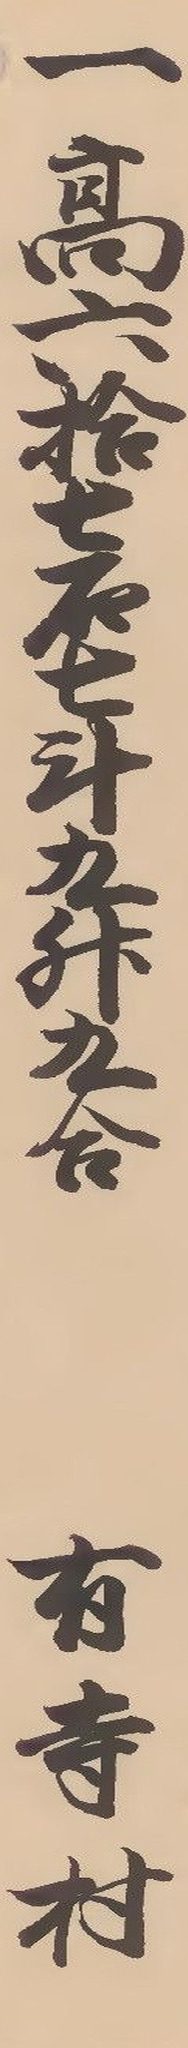一高六拾七石七斗九升九合有寺村
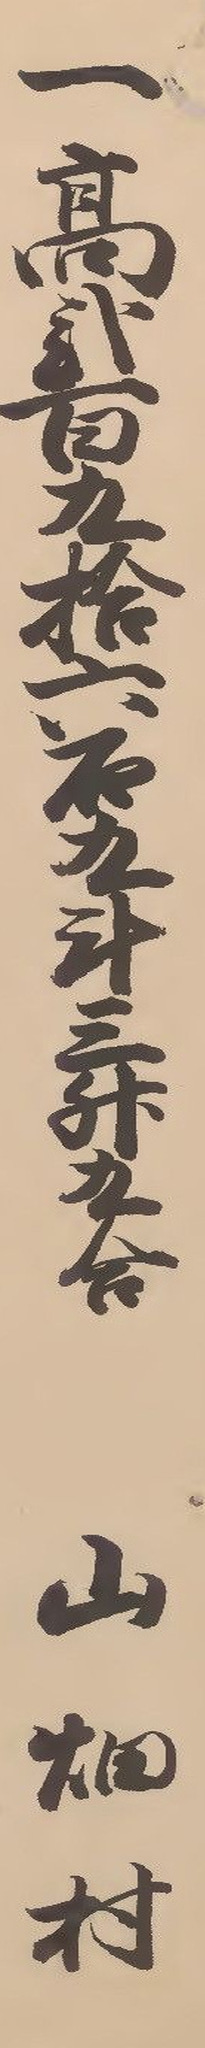一高弐百九拾六石九斗三升九合山畑村
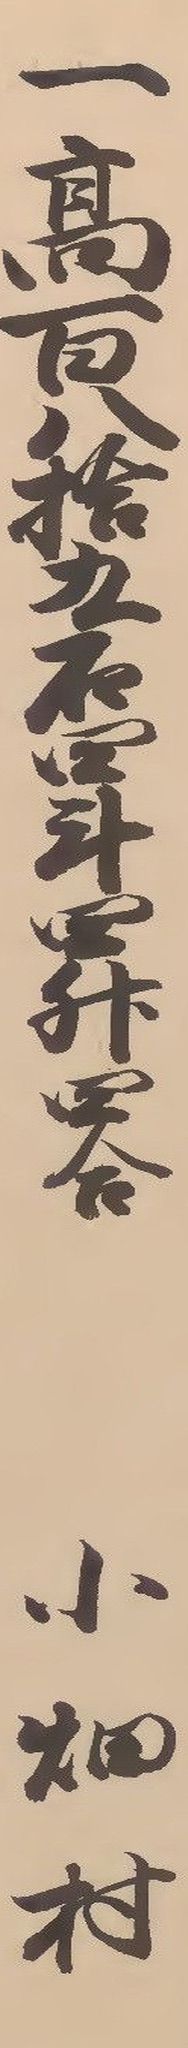一高百八拾九石四斗四升四合小畑村
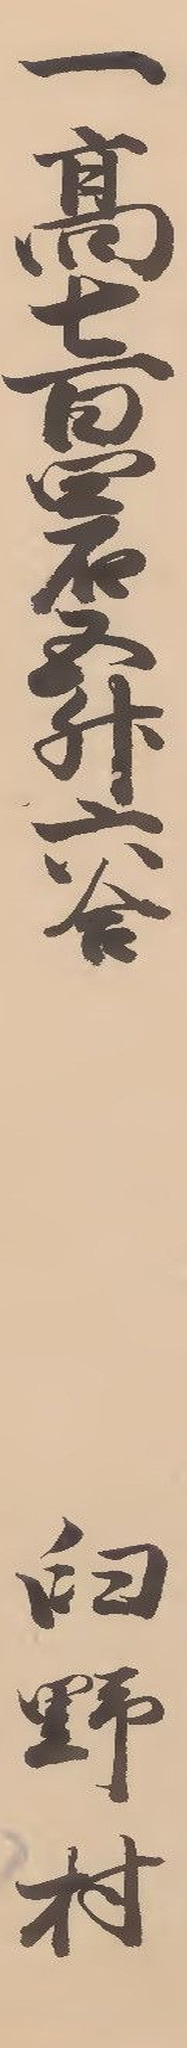一高七百四石五升六合臼野村
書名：豊後国郷帳
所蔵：国立公文書館 National Archives of Japan
